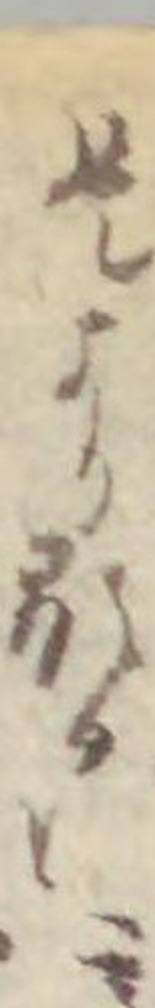是より顕ると
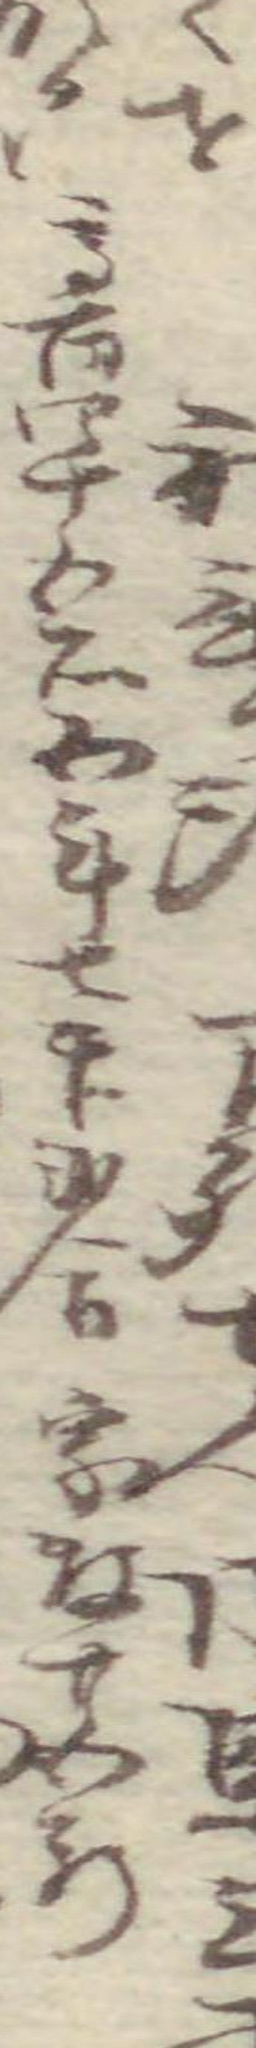高百四十五石五斗七升弐合家数廿五軒
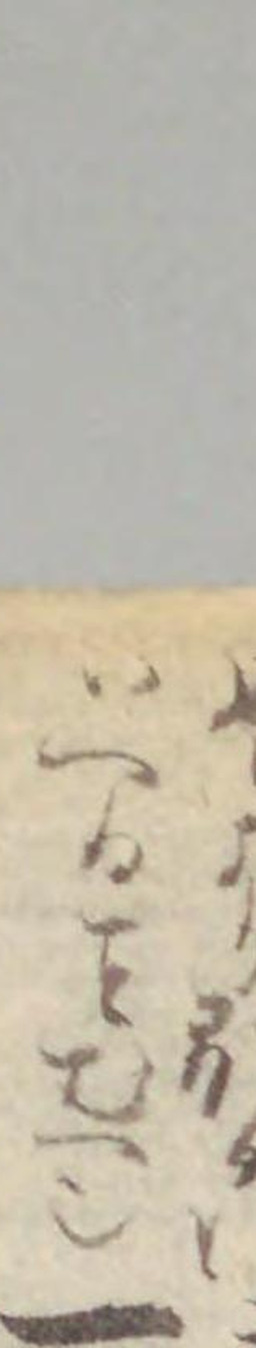いへることむへ也
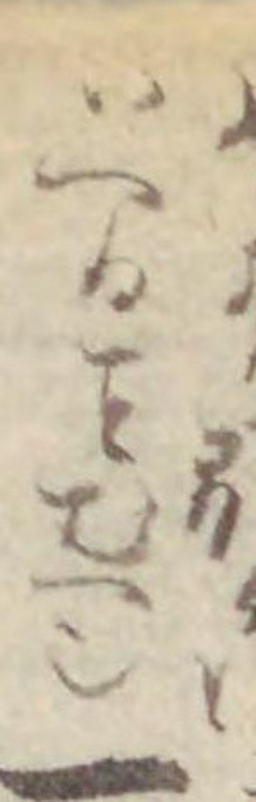いへることむへ也
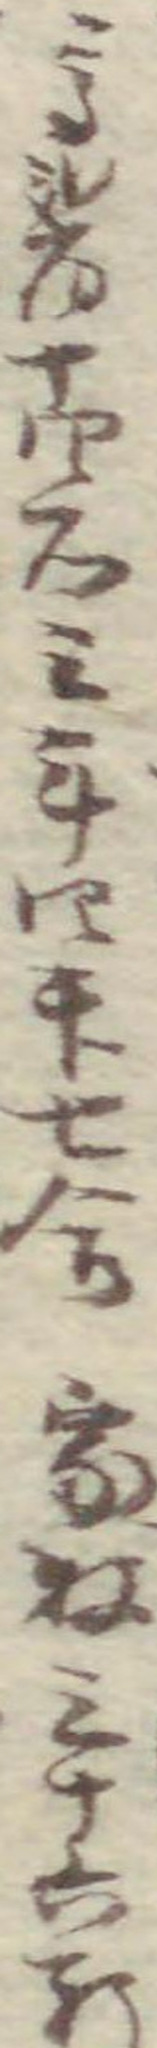高弐百十四石三斗四升七合家数三十六軒
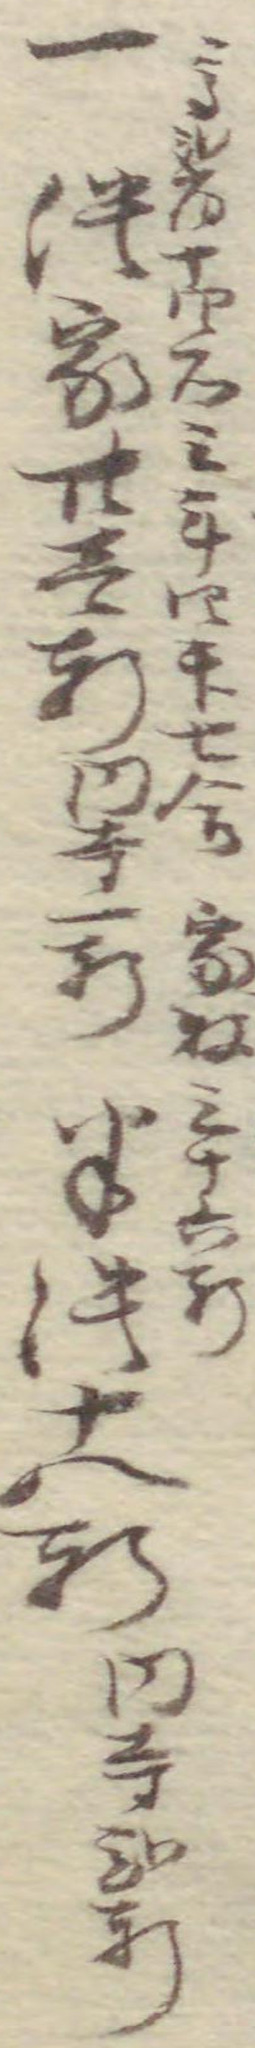一潰家廿壱軒内寺一軒半潰十八軒内寺弐軒矢田村
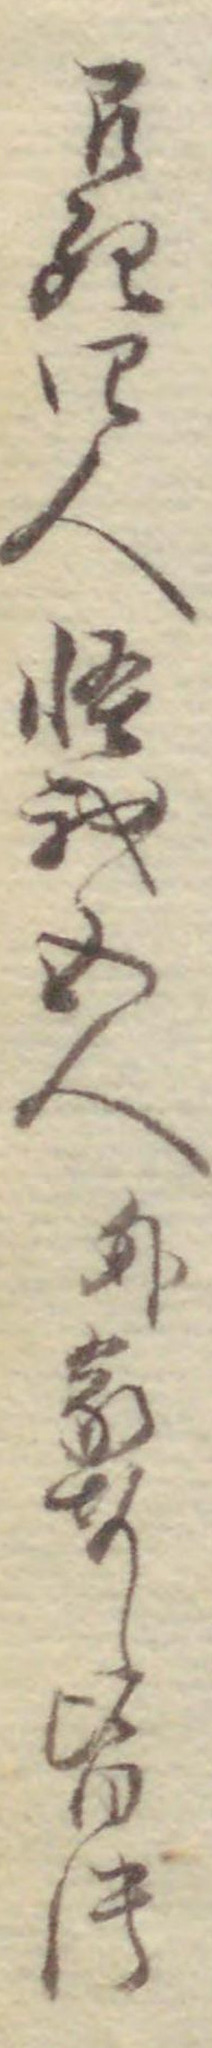即死四人怪我五人外家なし皆潰

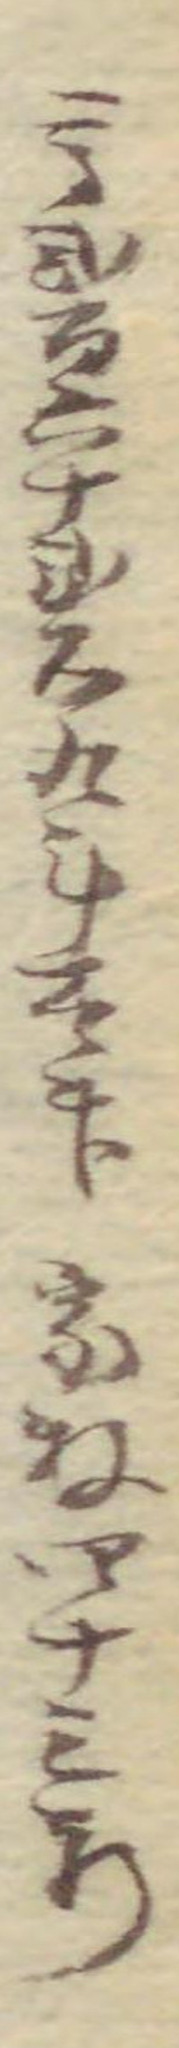高弐百六十弐石九斗壱升家数四十三軒
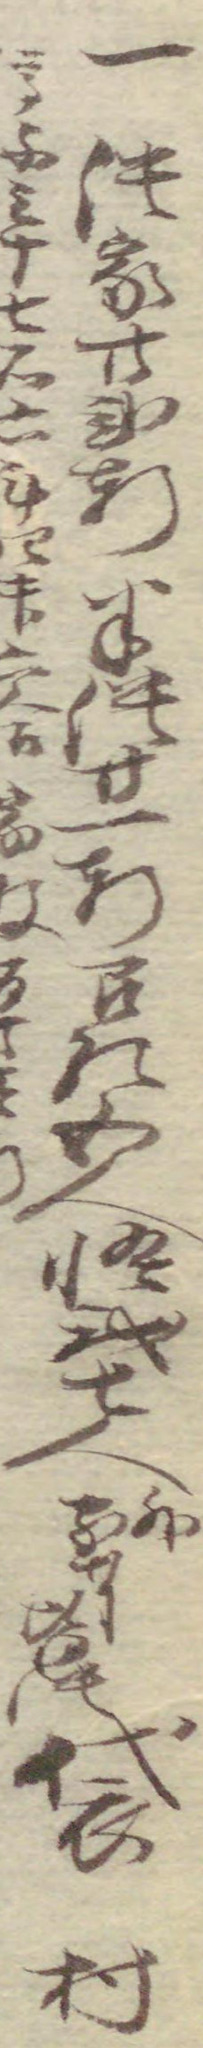一潰家廿弐軒半潰廿一軒即死五人怪我七人外家なし皆潰袋村
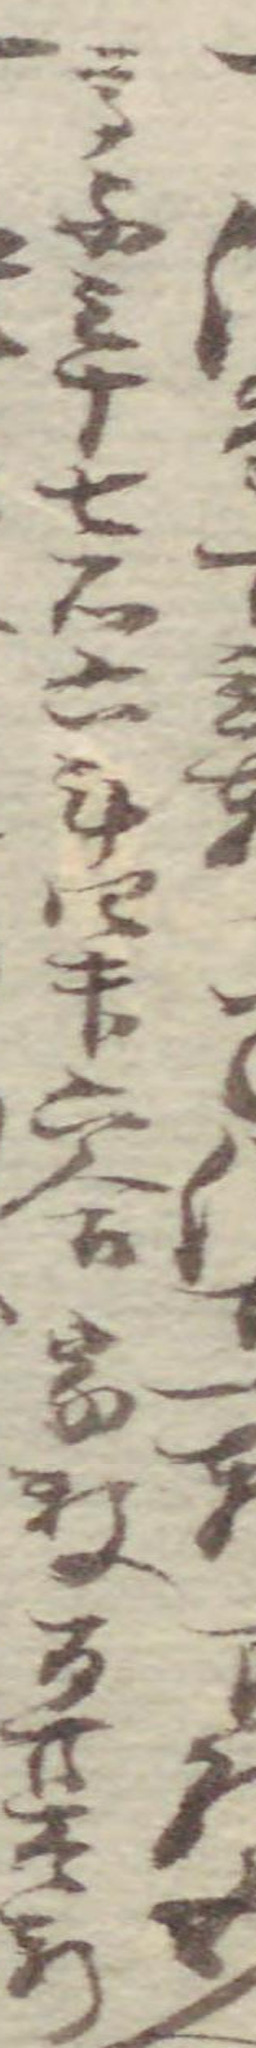高千三十七石六斗四升六合家数百廿一軒
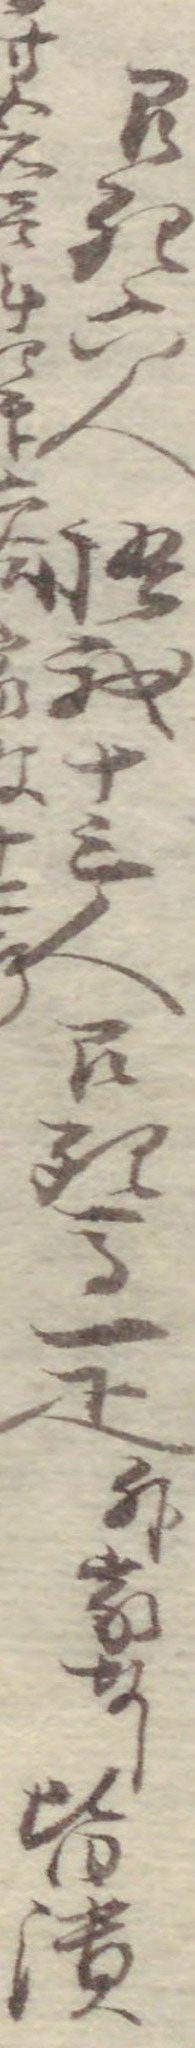即死六人怪我十三人即死馬一疋外家なし皆潰
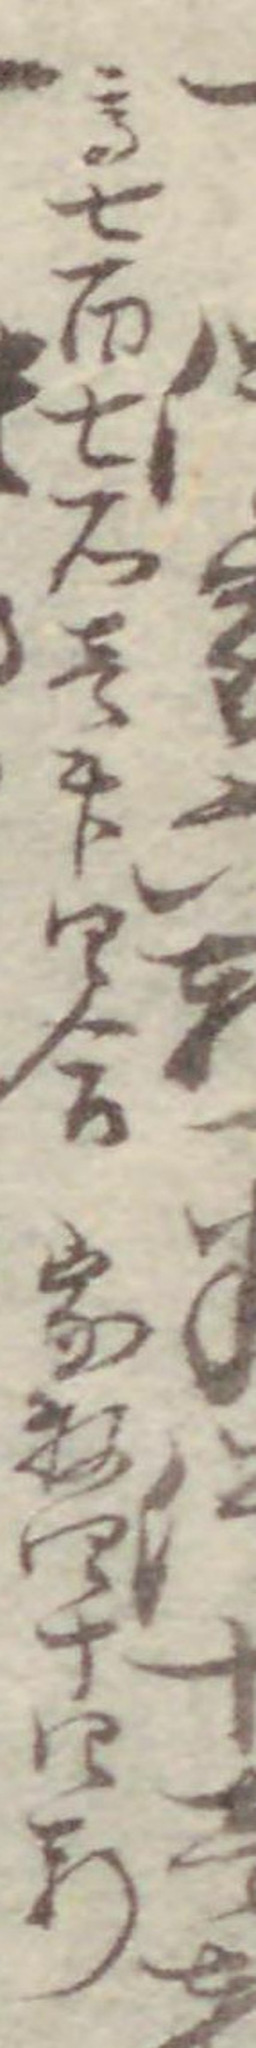高七百七石壱升四合家数四十四軒
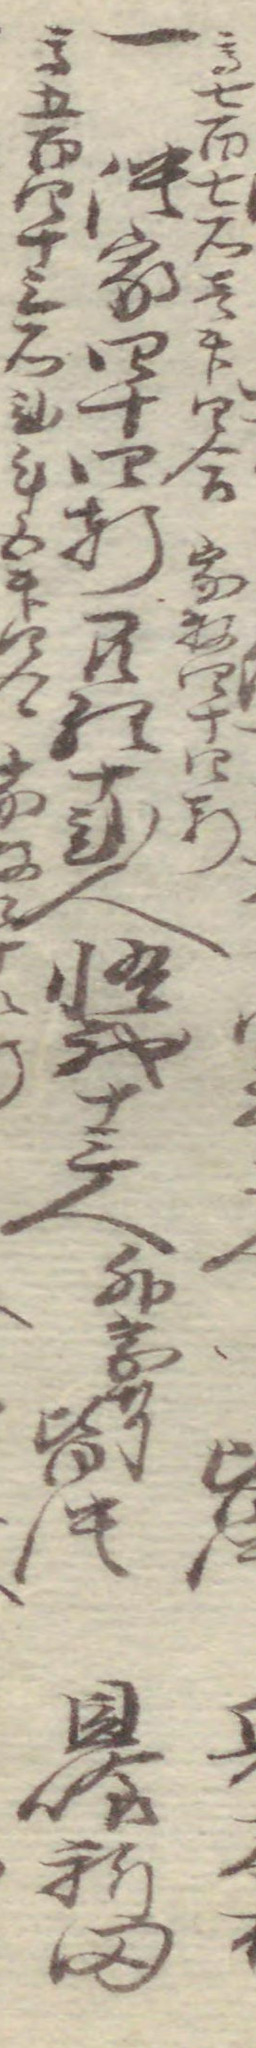一潰家四十四軒即死十弐人怪我十三人外家なし皆潰貝喰新田
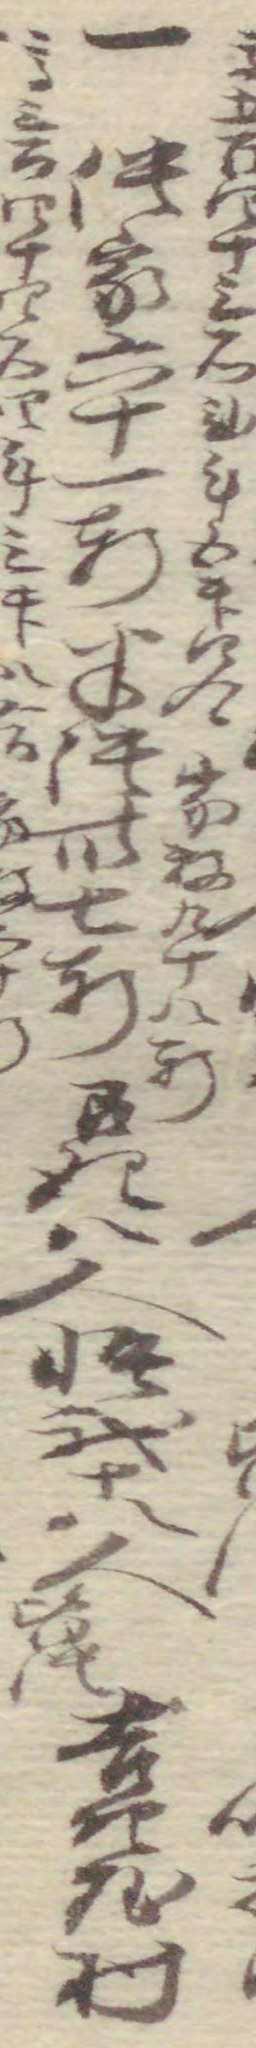一潰家六十一軒半潰卅七軒即死八人怪我十八人皆潰吉野屋村
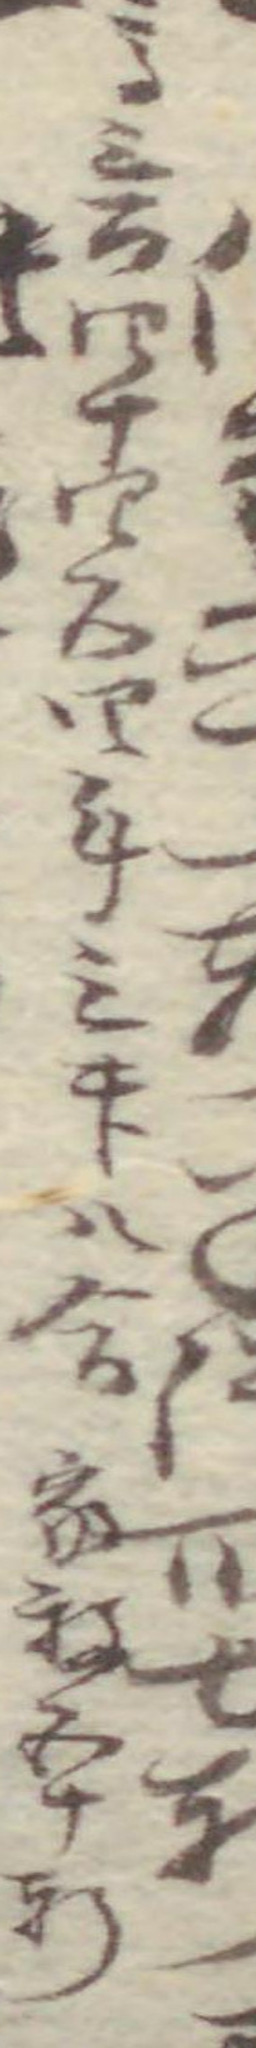高三百四十四石四斗三升八合家数五十軒
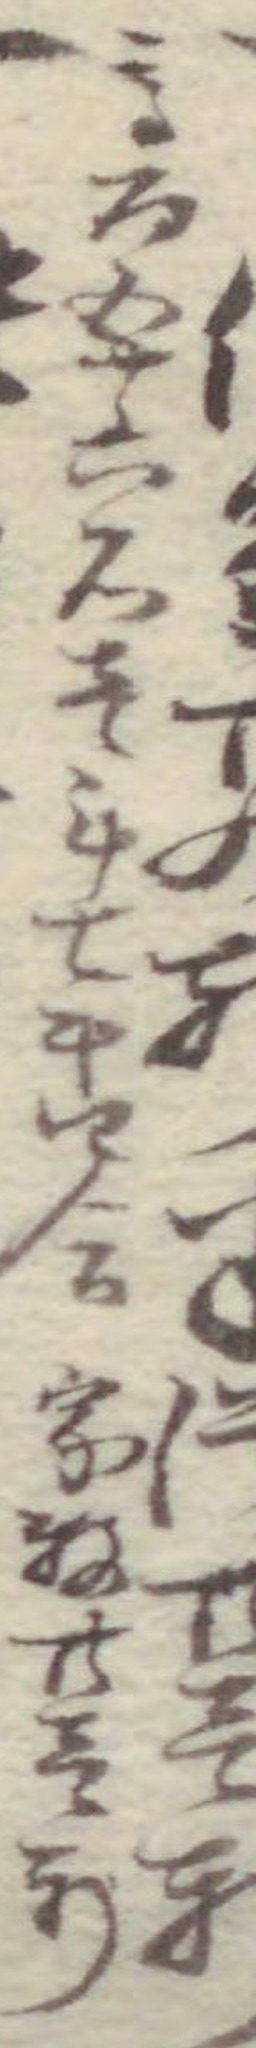高百五十六石壱斗七升四合家数廿壱軒
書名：鶯宿雑記. 巻199-200
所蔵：国立国会図書館 National Diet Library, JAPAN
